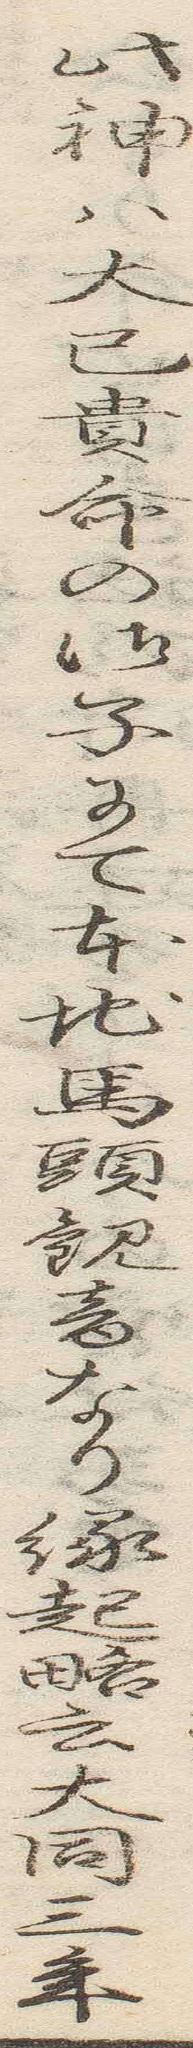此神は大己貴命の御子にて本地馬頭觀音なり縁起略云大同三年
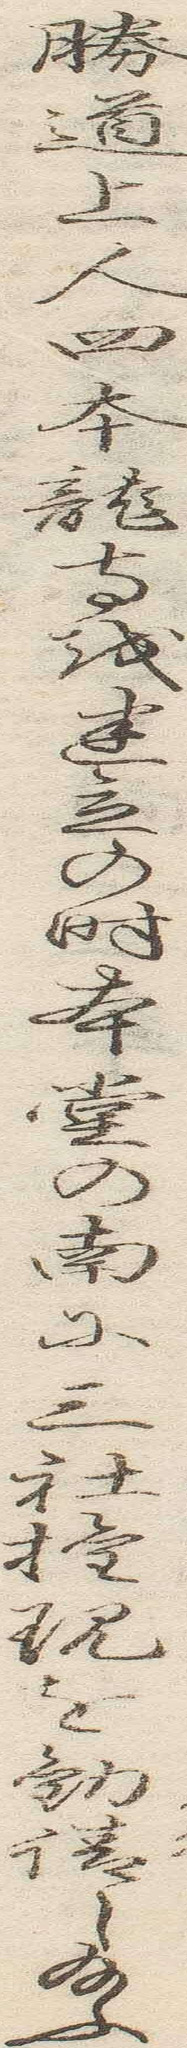勝道上人四本龍寺を建立の时本堂の南に三社權現を勸請し給ふ
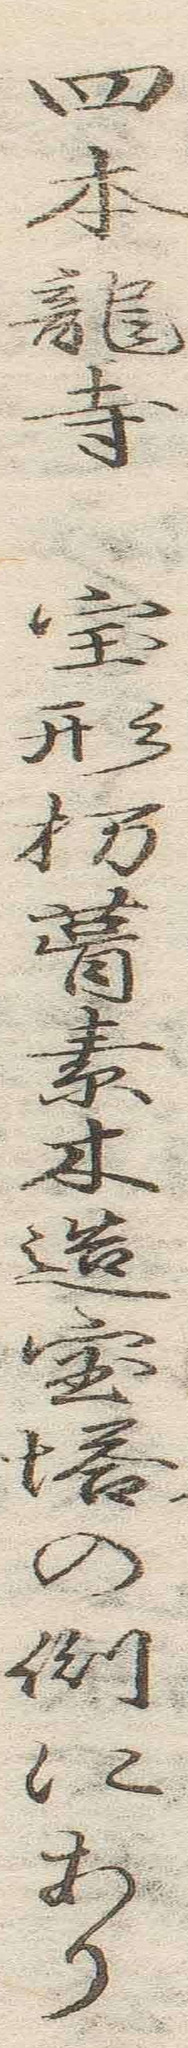四本龍寺宝形栃葺素木造宝塔の側にあり
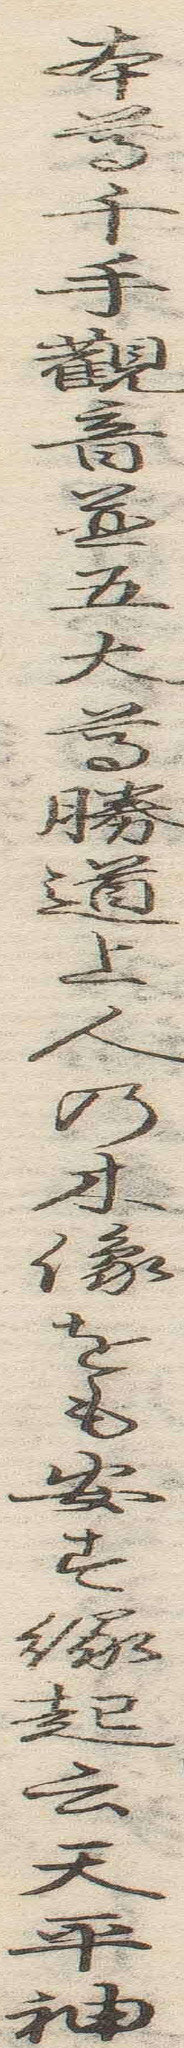本尊千手觀音並五大尊勝道上人の木像をも安す縁起云天平神

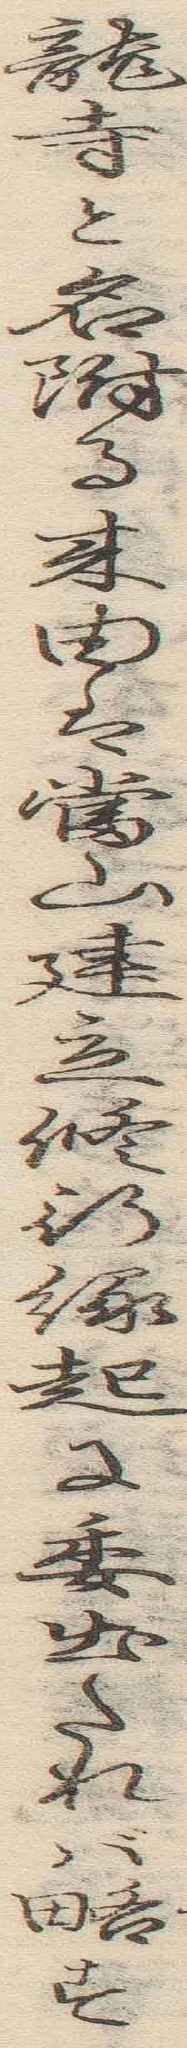龍寺と名附る来由は當山建立修行縁起に委出たれば略す
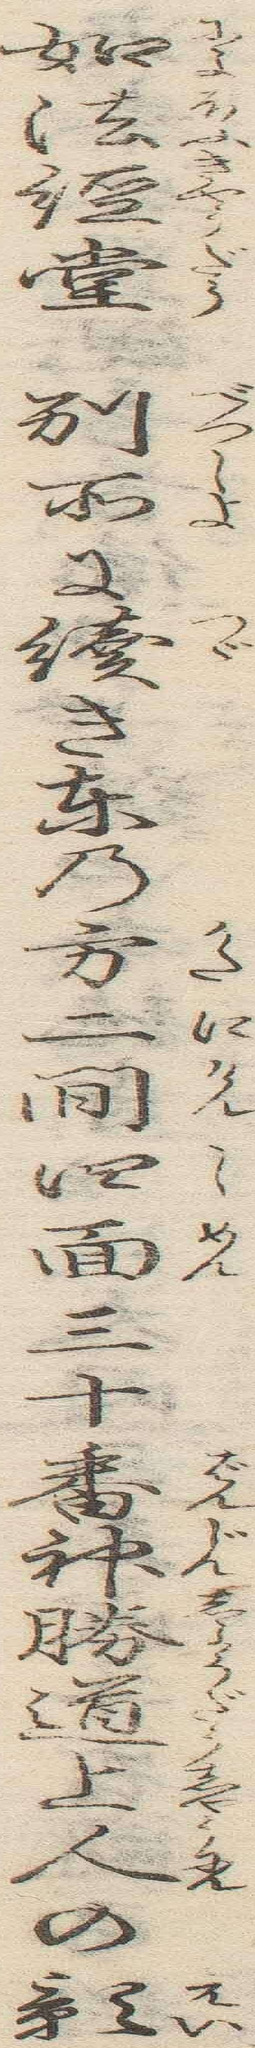如法經堂別所に續き東の方二間四面三十番神勝道上人の影
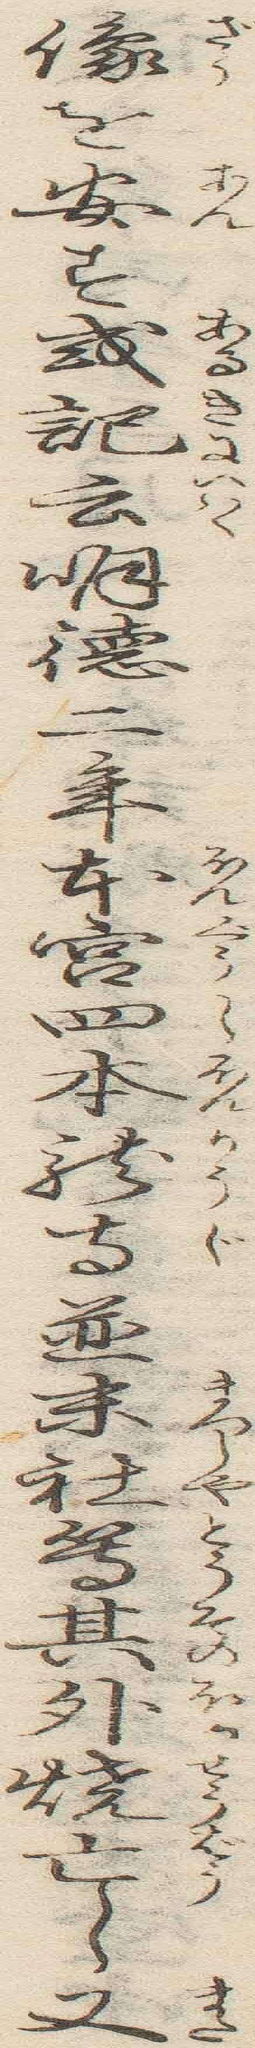像を安す或記云明德二年本宮四本龍寺並末社等其外焼亡し又
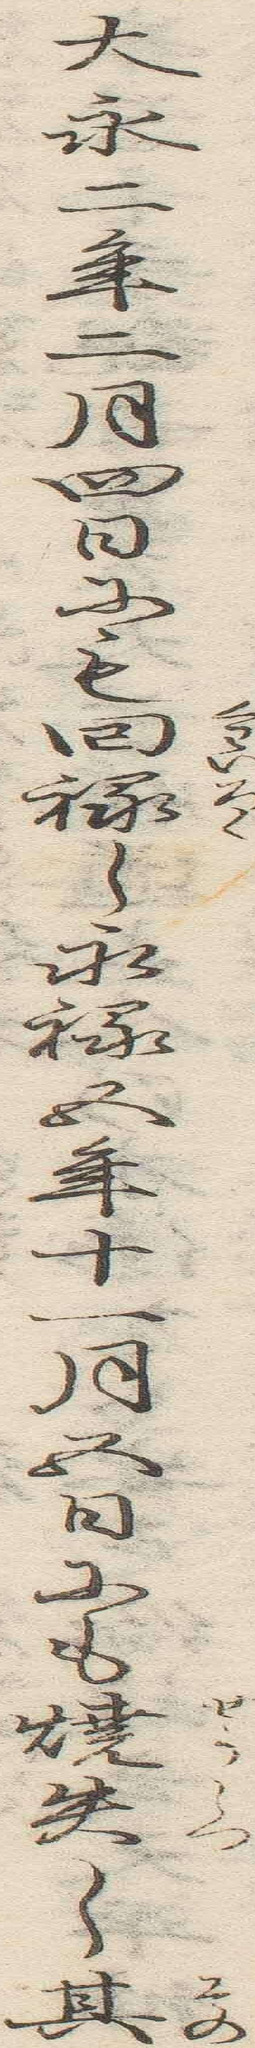大永二年二月四日にも囘禄し永禄五年十一月五日にも焼失し其
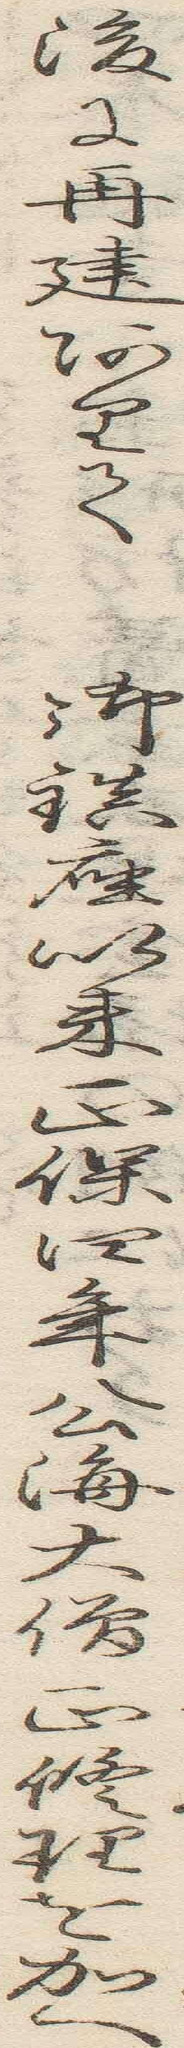後に再建ありて御鎭座以来正保四年公海大僧正修理を加へ
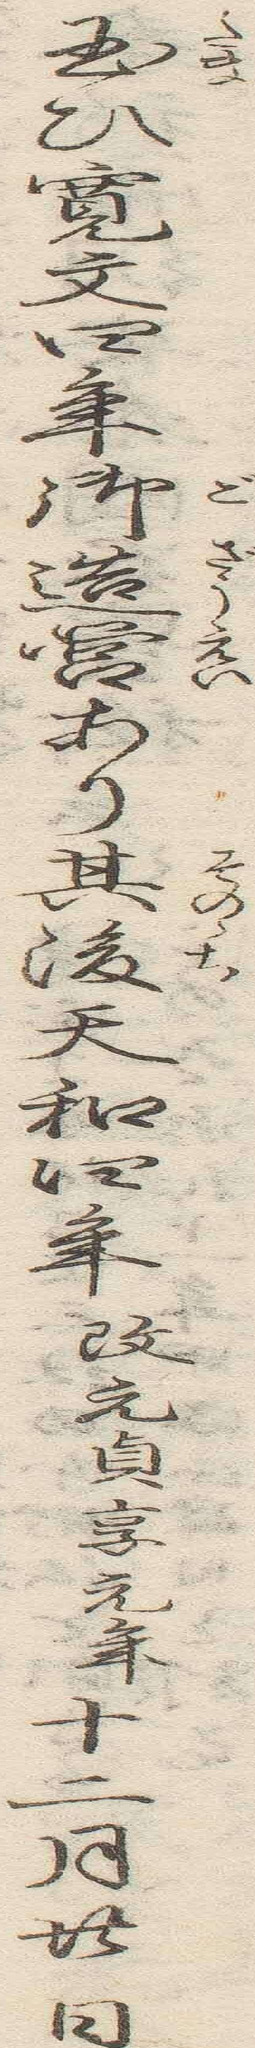玉ひ寛文四年御造営あり其後天和四年改元貞享元年十二月廿日
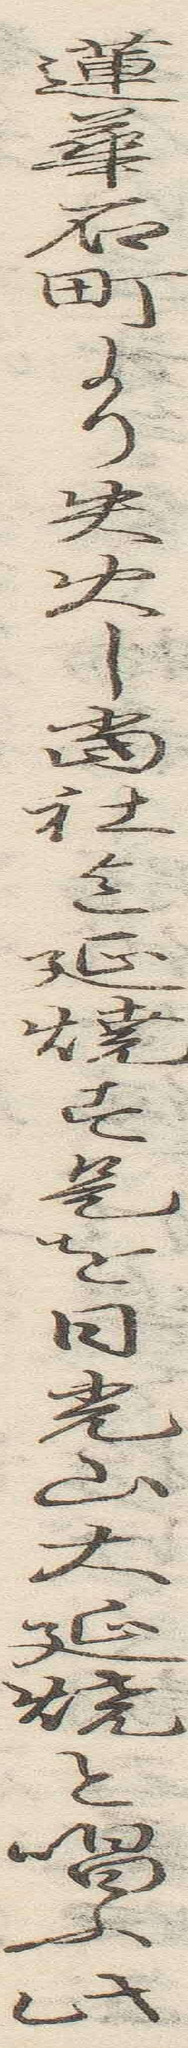蓮華石町より失火し當社迠延焼す是を日光山大延焼と唱ふ此
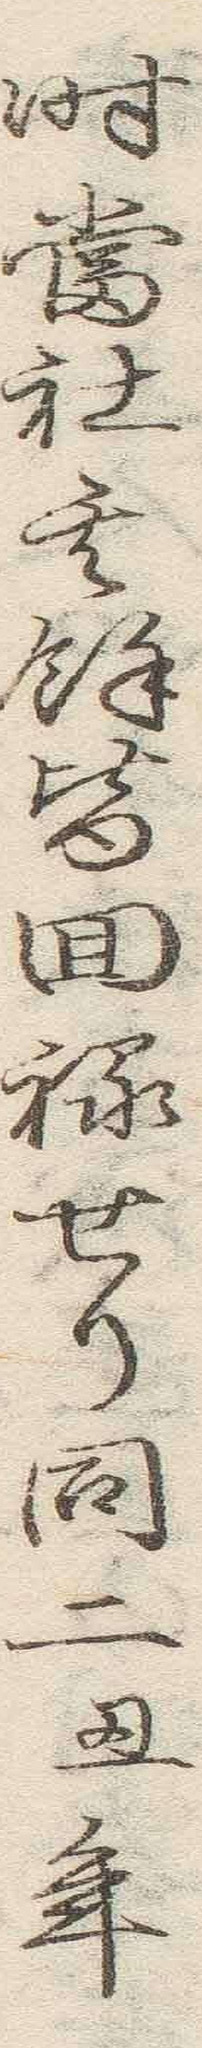时當社其餘皆囬禄せり同二丑年
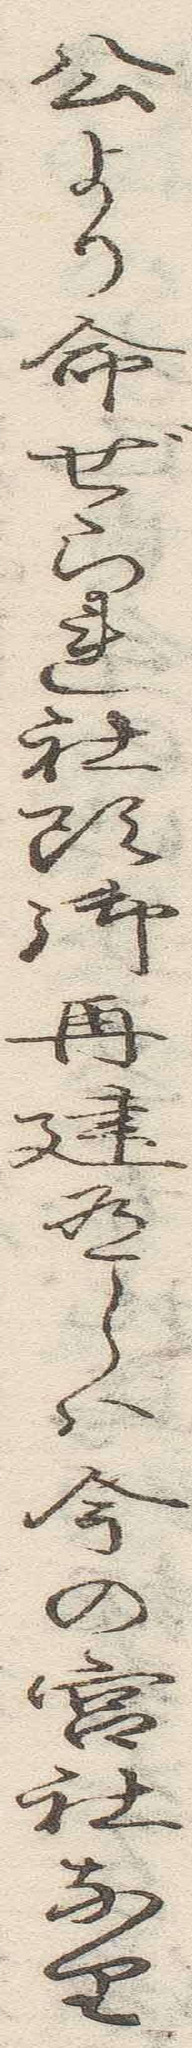公より命ぜられ社頭御再建有しは今の宮社なり
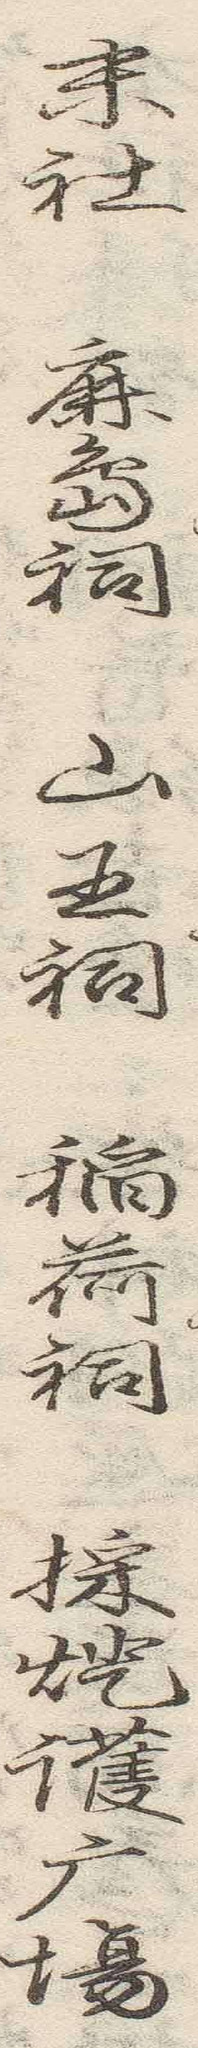末社鹿島祠山王祠稲荷祠採燈護广塲
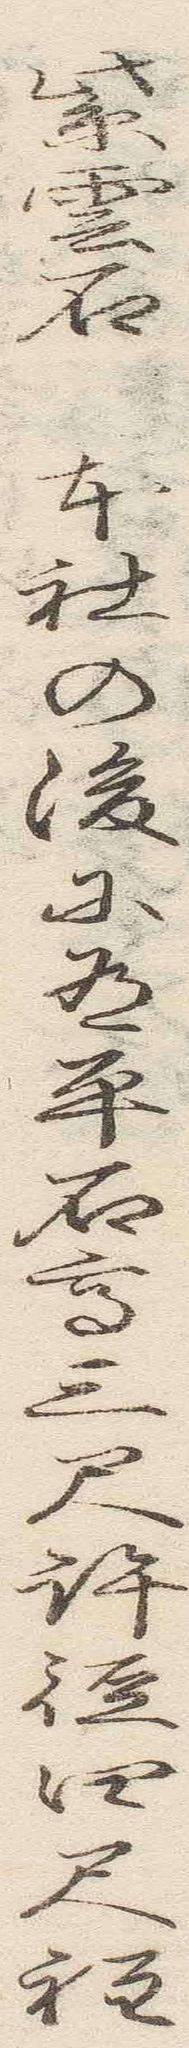紫雲石本社の後に有平石高三尺許徑四尺程
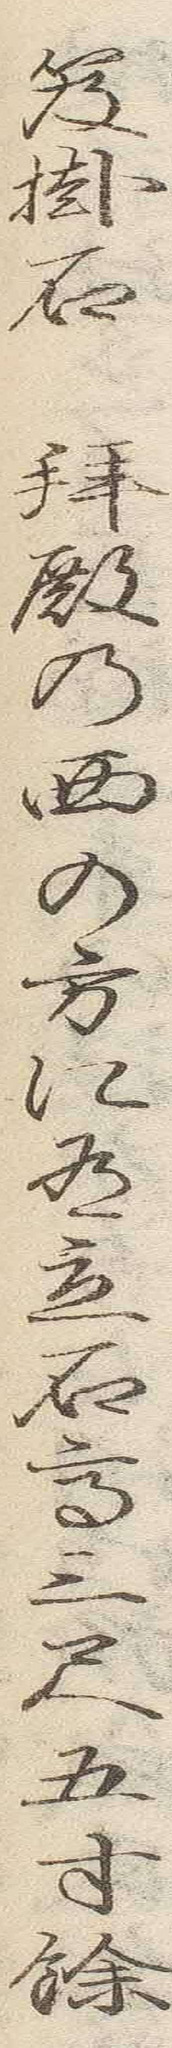笈掛石拜殿の西の方に有立石高三尺五寸餘
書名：日光山志
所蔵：東京学芸大学附属図書館 国文学研究資料館
